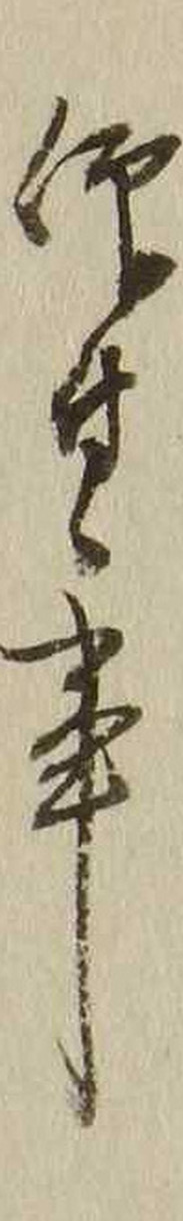仰付候事
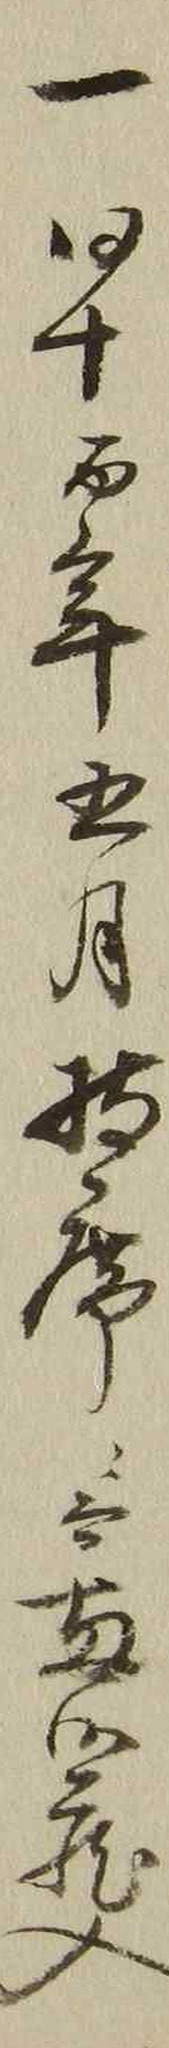一同十酉年五月持席ニ而両御蔵入
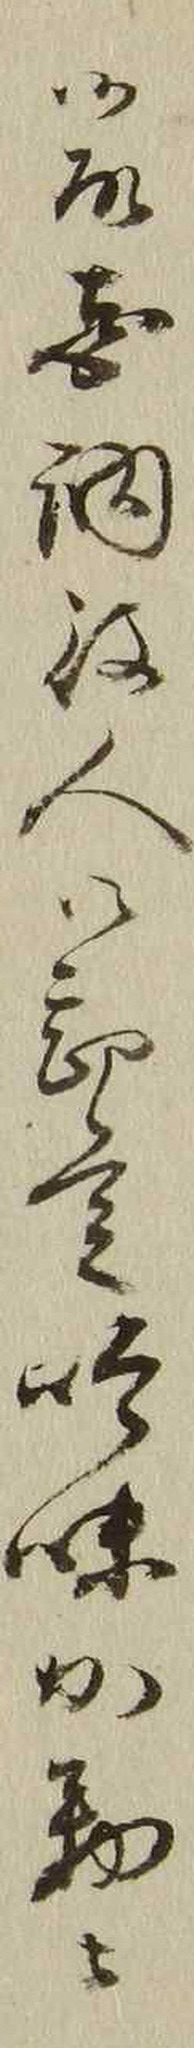御取固調役人御勘定吟味加勤被
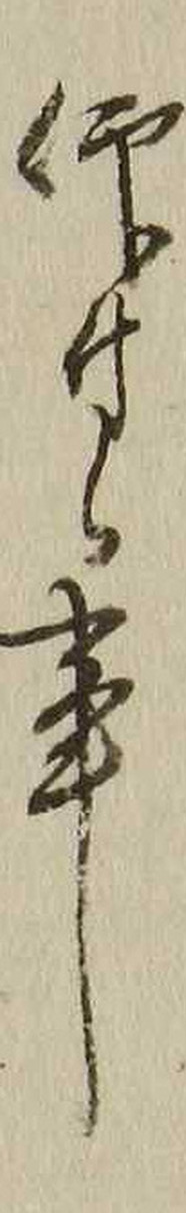仰付候事
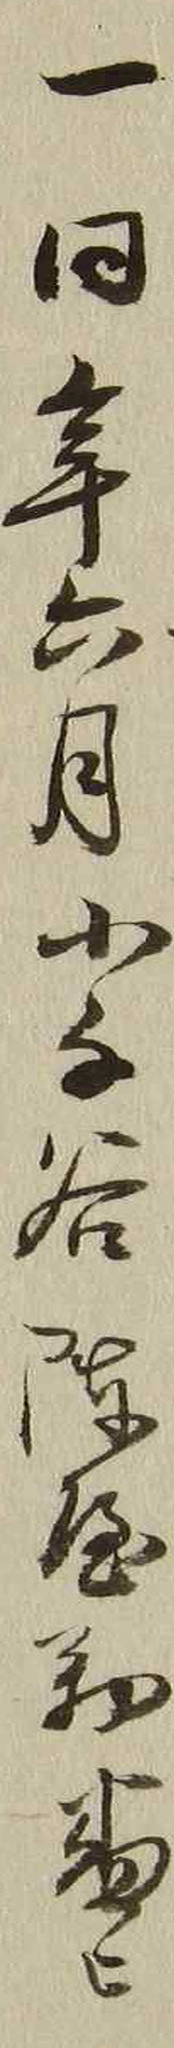一同年六月小千谷陣屋勤番被
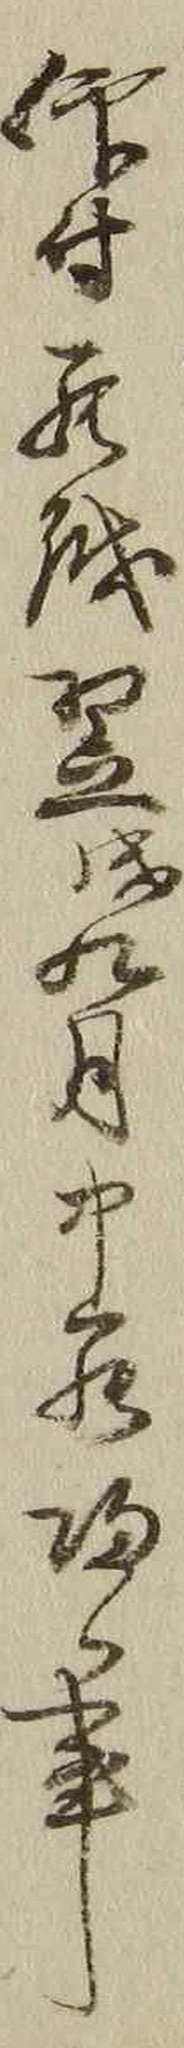仰付罷越翌戌九月中罷帰候事
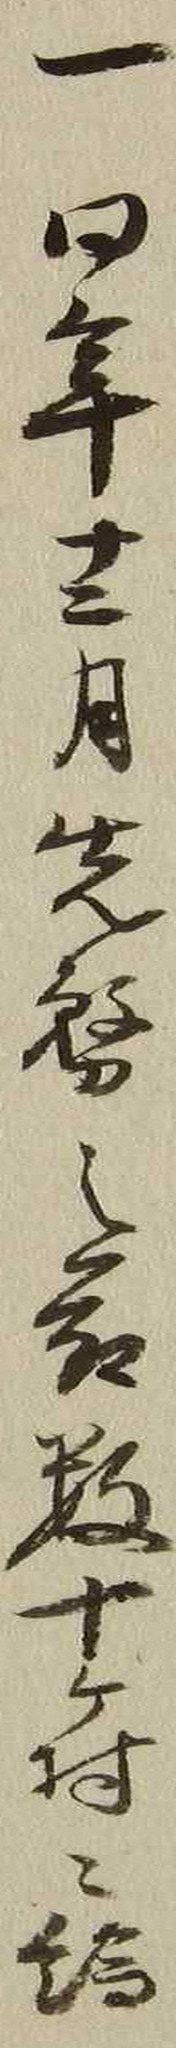一同年十二月先務之節数十ヶ村々絵
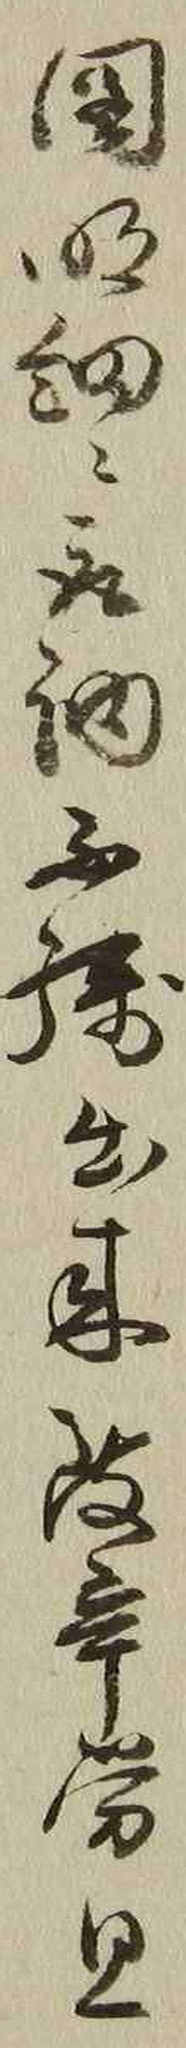図明細ニ取調不残出来致辛労且
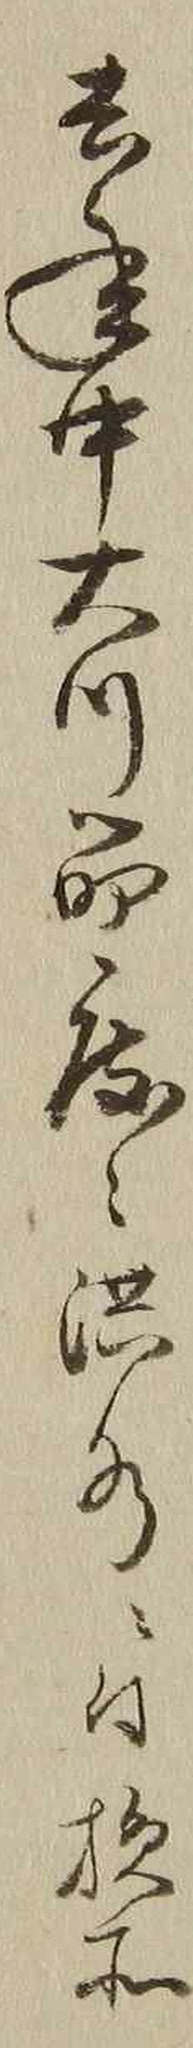去年中大川筋度々洪水ニ付損所
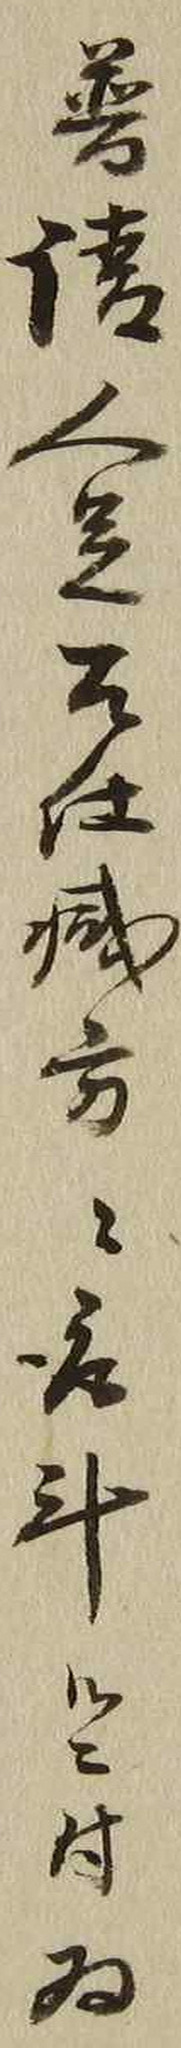普請人足召仕減方ニ取計候ニ付為
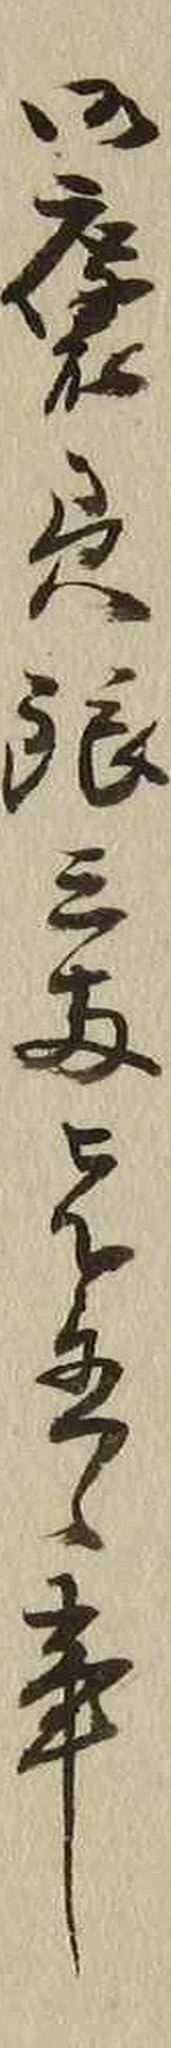御褒美銀三両被下置候事
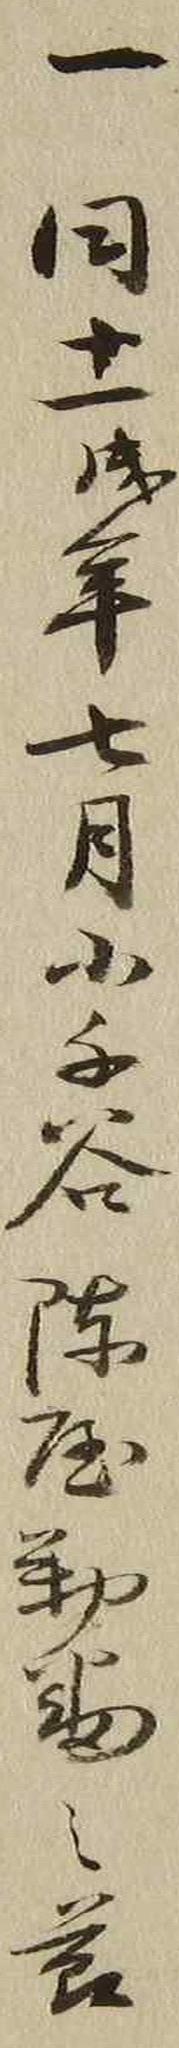一同十一戌年七月小千谷陣屋勤番之節
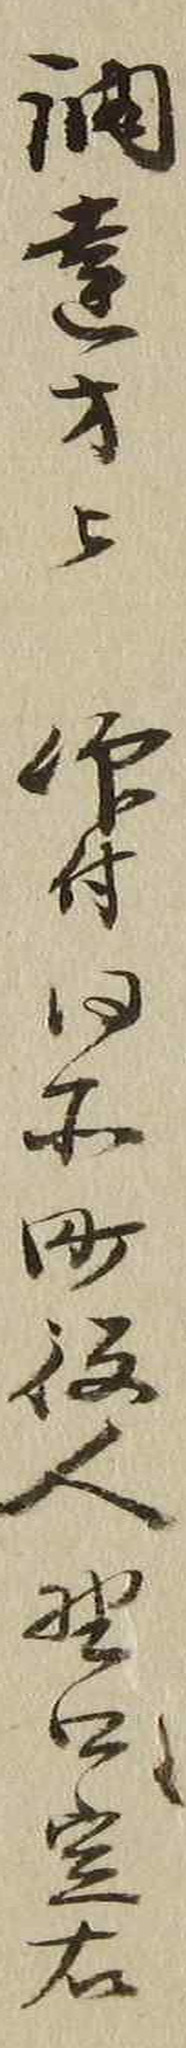調達方被仰付同所町役人野口定右
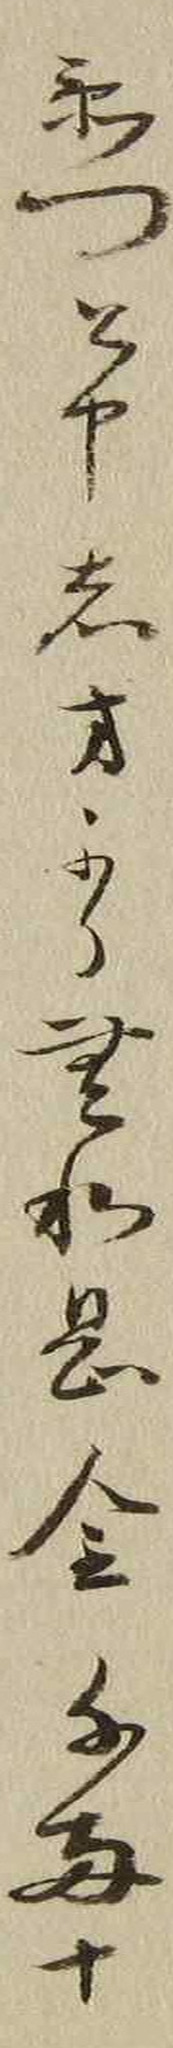衛門と申者方から無利息金千両十
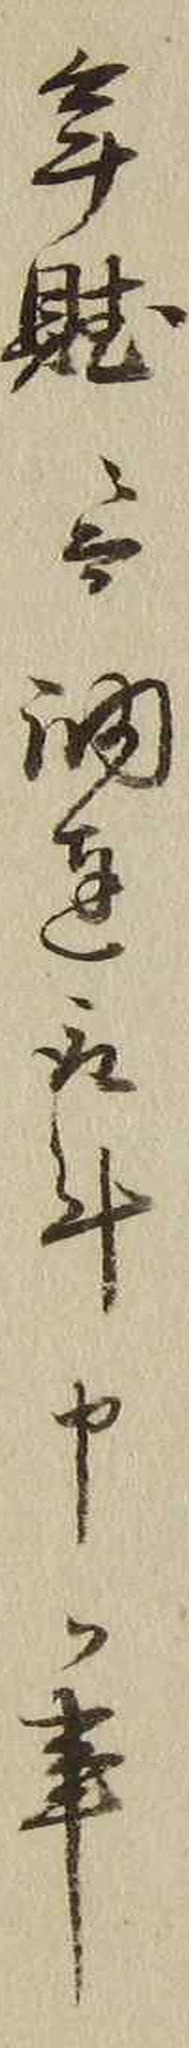年賦ニ而調達取計申候事
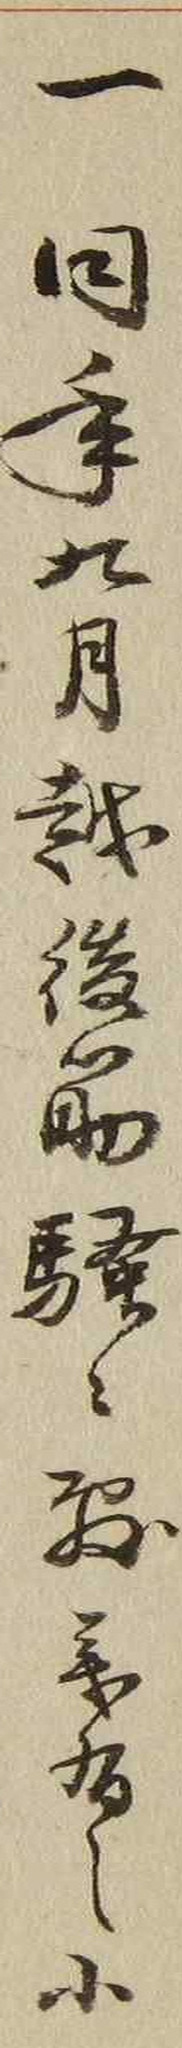一同年九月越後筋騒々敷義有之小
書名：諸士系譜　巻之236　ふ之部4
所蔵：会津若松市立会津図書館
